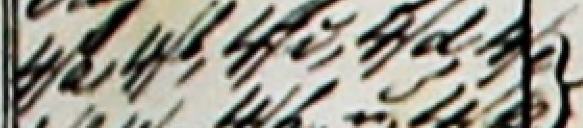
4/a, 4/b, 4/c, 4/d, 4/e
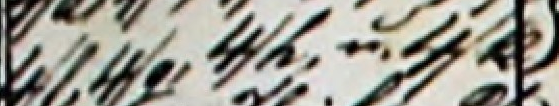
4/f, 4/g, 4/h, u. 4/k
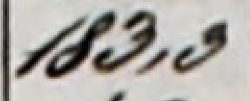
183,3
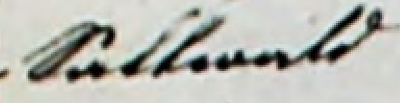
Sattwald
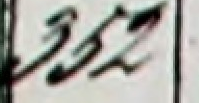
352
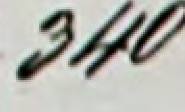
340
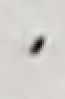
„
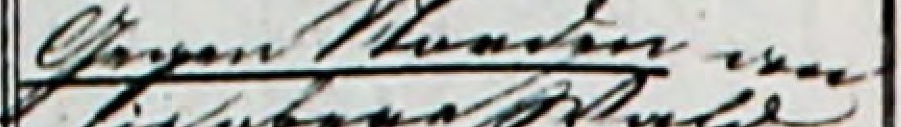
Gegen Norden an
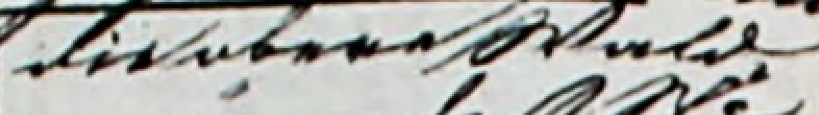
die obere Wald„
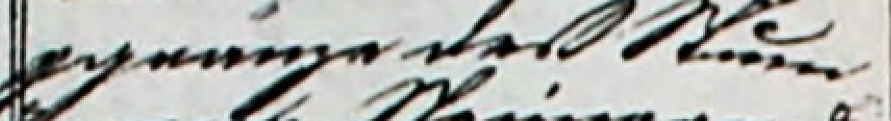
egranze des Stum„
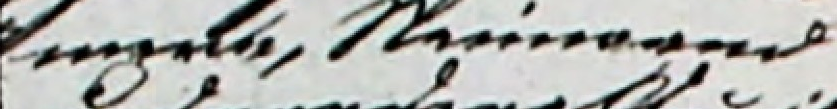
werk, Neimorad
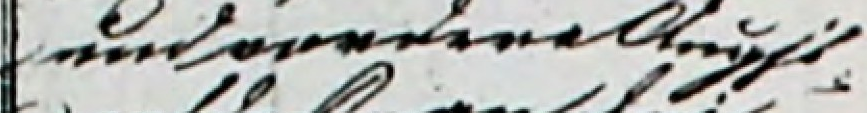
und vordere Augss
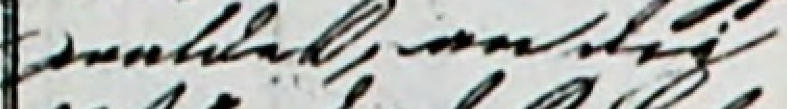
waldes, an die
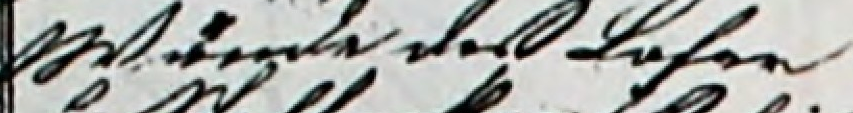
Wände des Loher
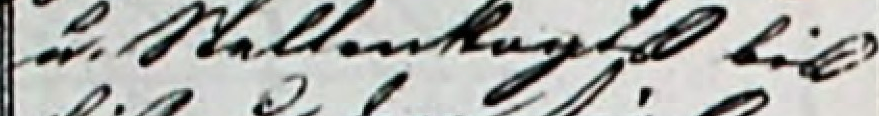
u. Stellenkogts bis
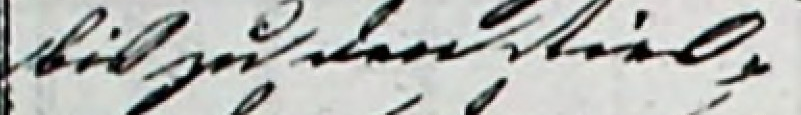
bis zu den Ries„
